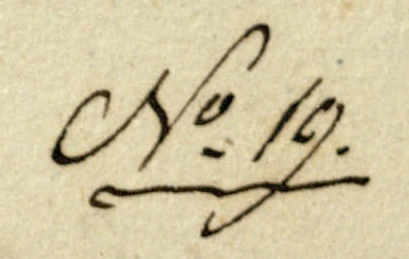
No 19.
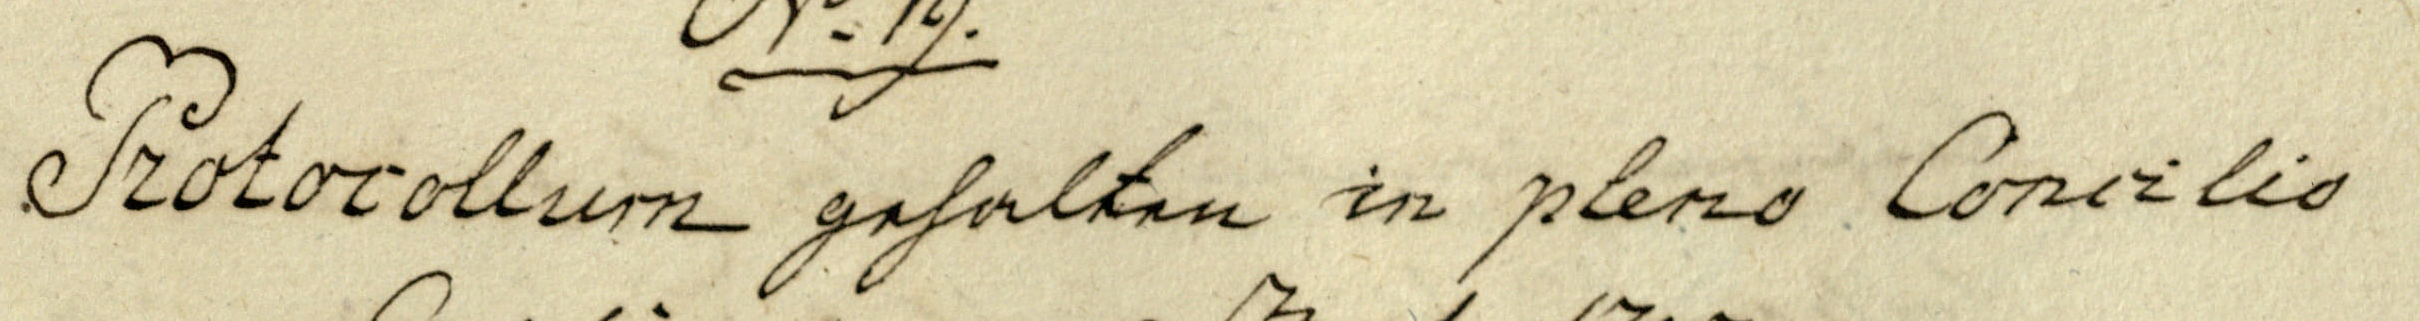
Protocollum gehalten in pleno Concilio
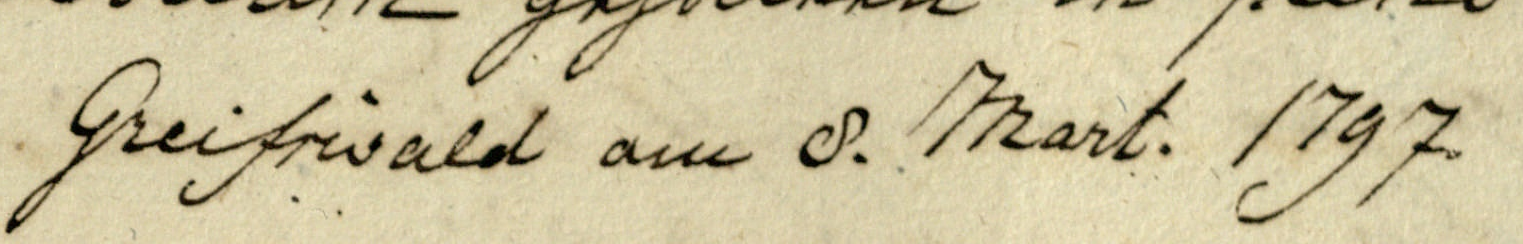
Greifswald am 8. Mart. 1797.
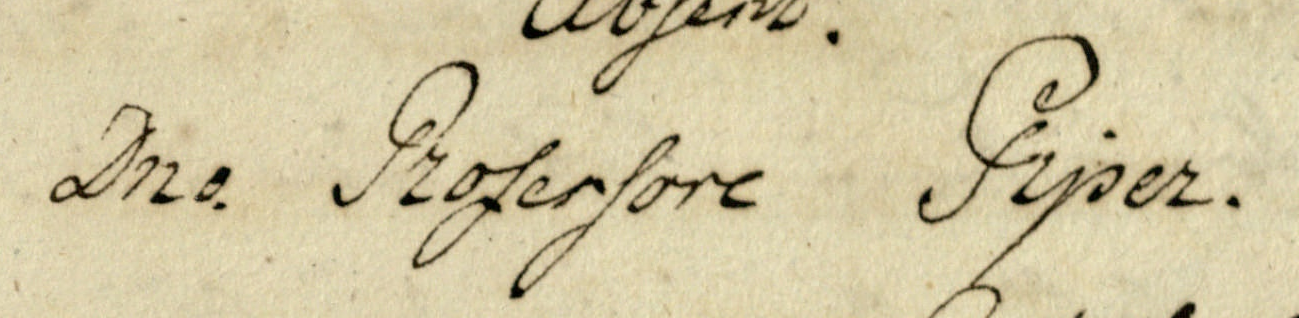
Dn. Professore Piper.
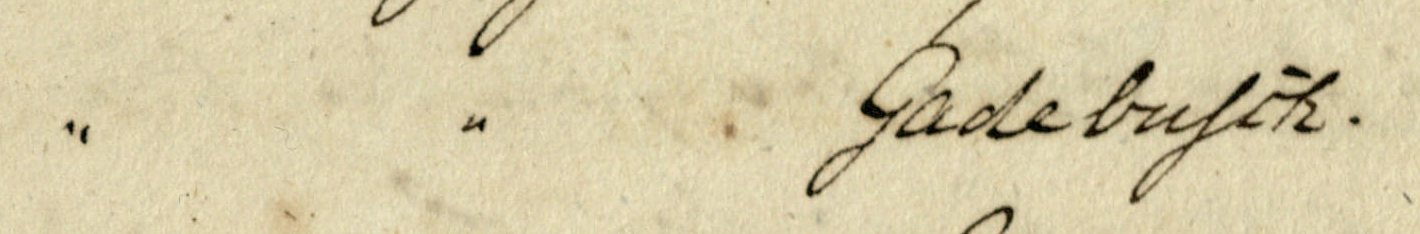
Gadebusch.
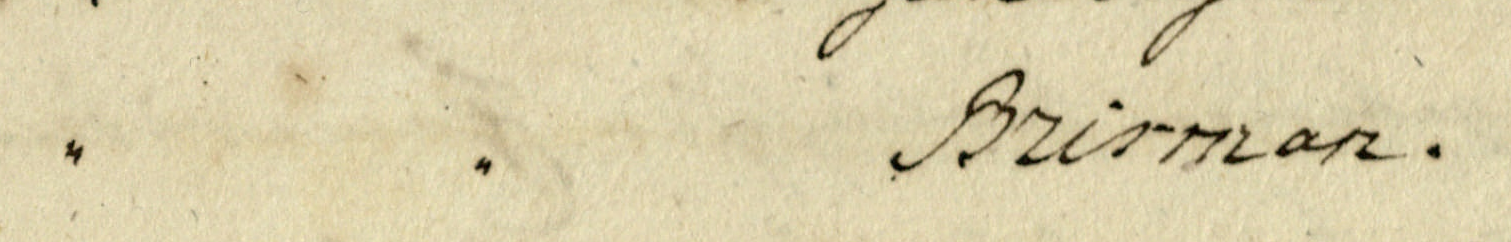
Brisman.
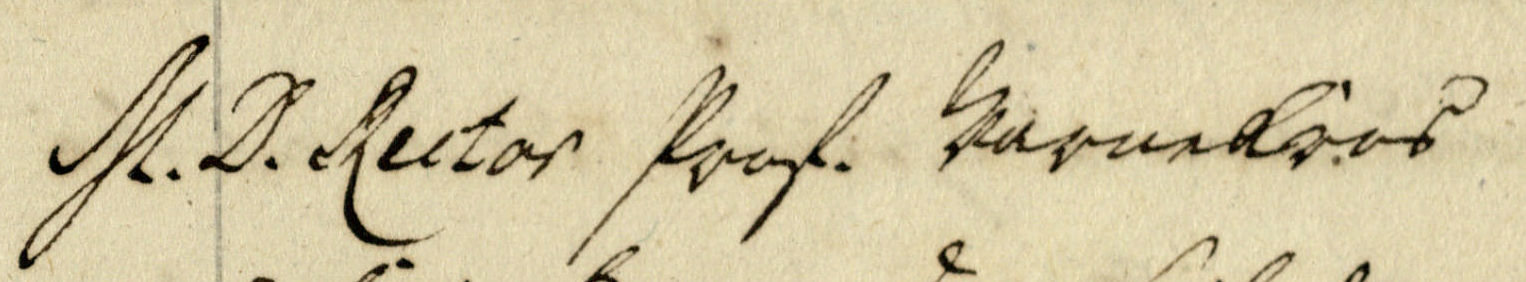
M. D. Rector Prof. Warnekros
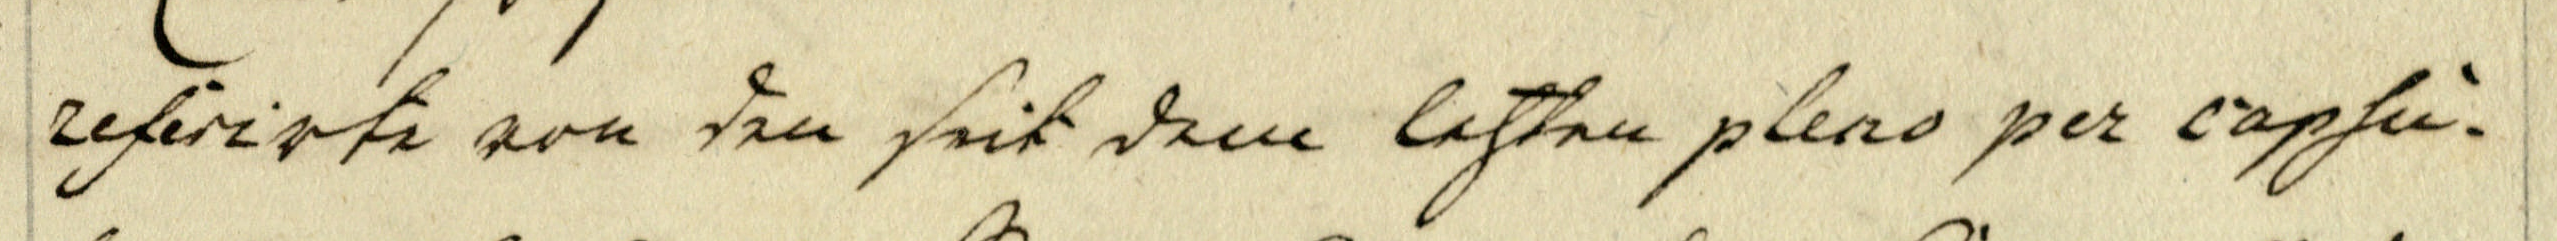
referirte von den seit dem letzten pleno per capsu¬
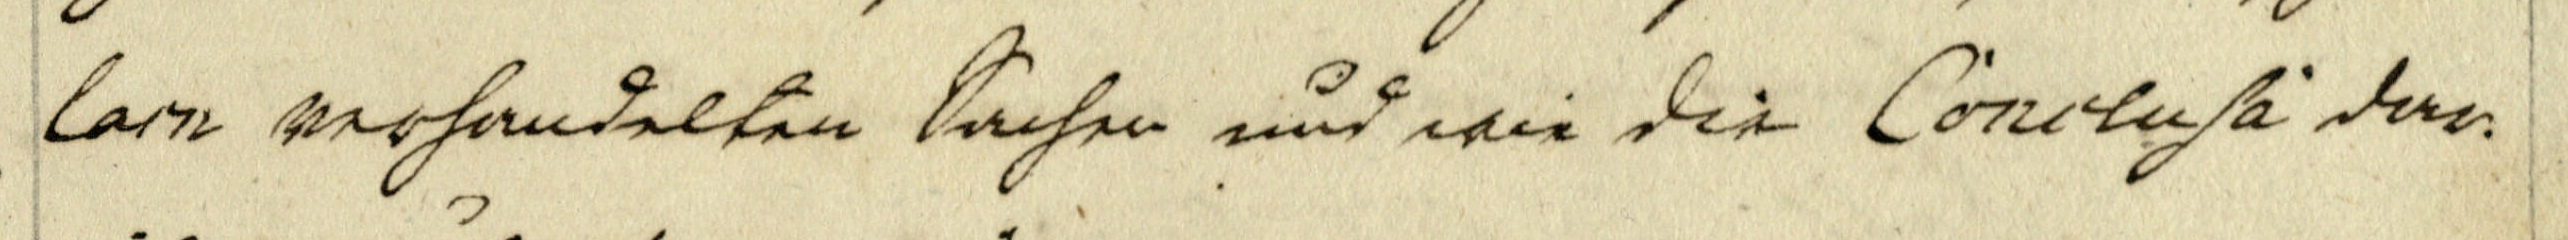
lam verhandelten Sachen und wie die Conclusa dar¬
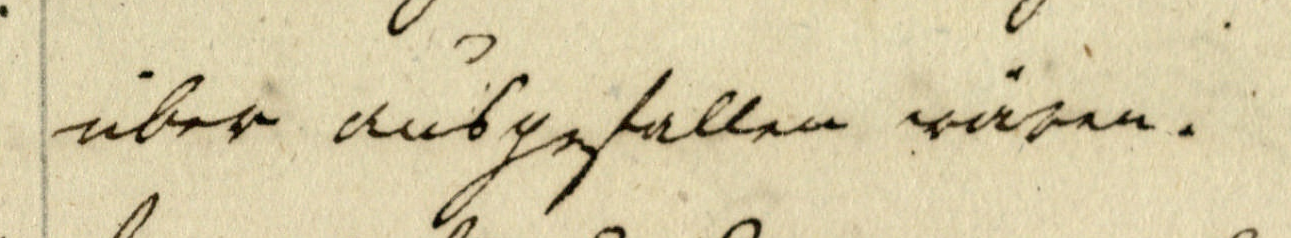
über ausgefallen wären.
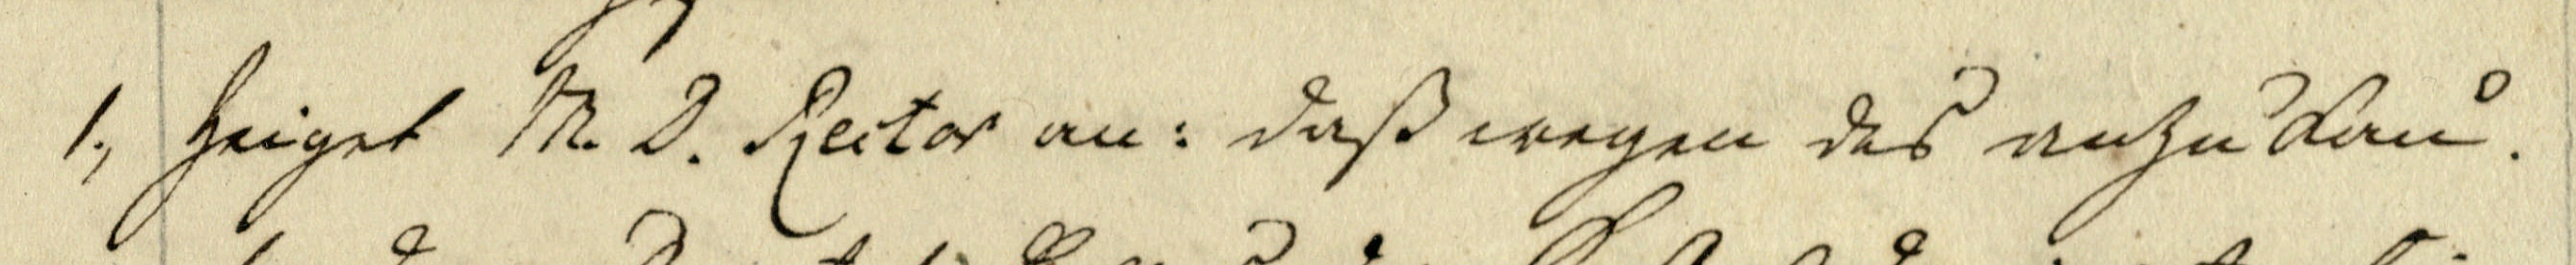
1., Zeiget M. D. Rector an: daß wegen des anzukau¬
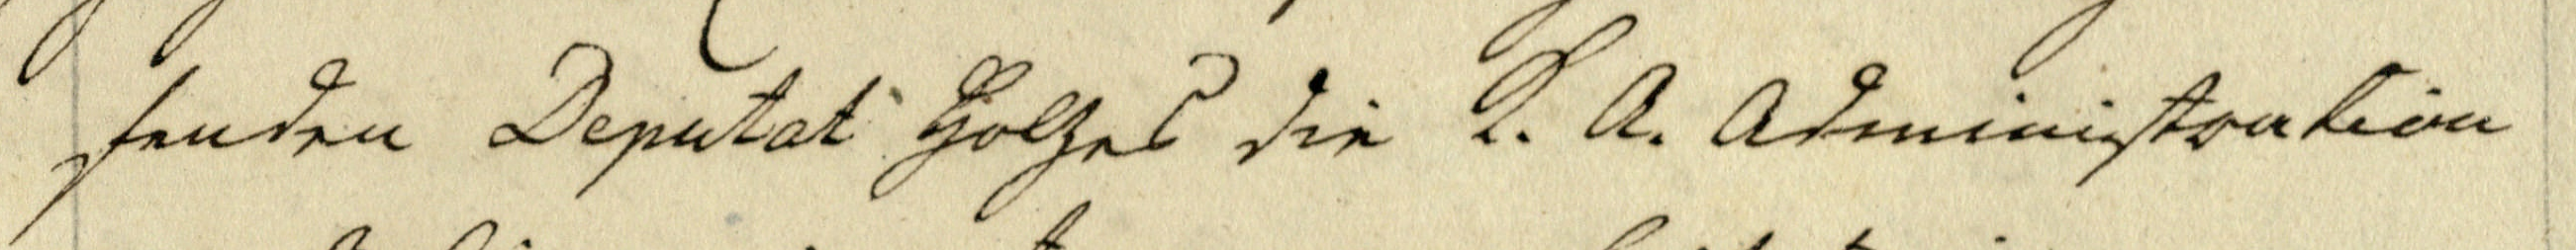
fenden Deputat Holzes die K. A. Administration
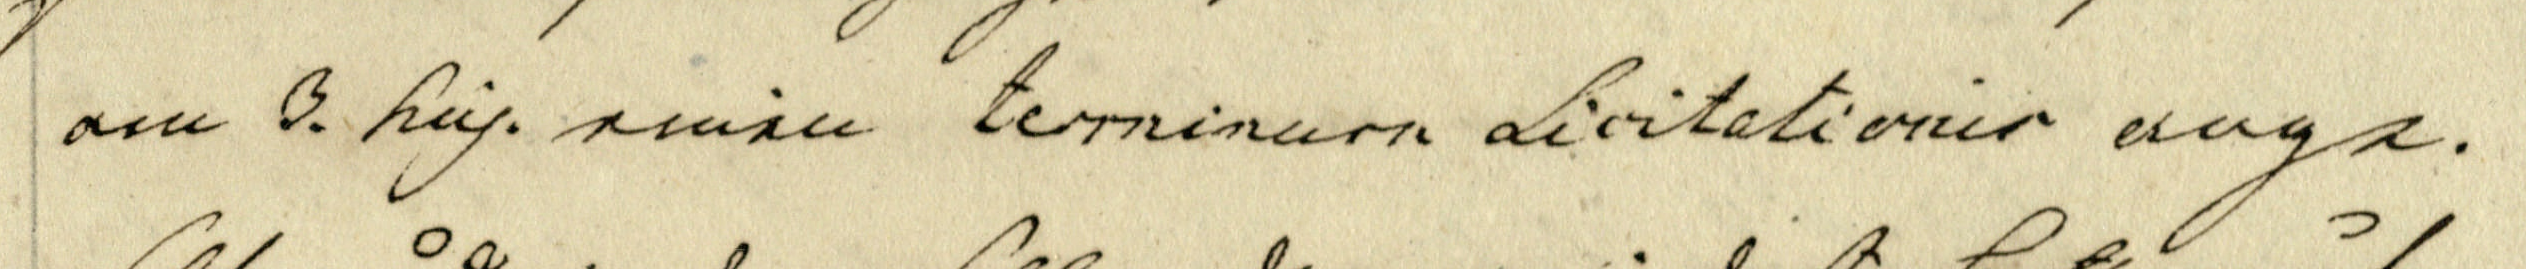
am 3. huj. einen terminum Licitationis ange¬
